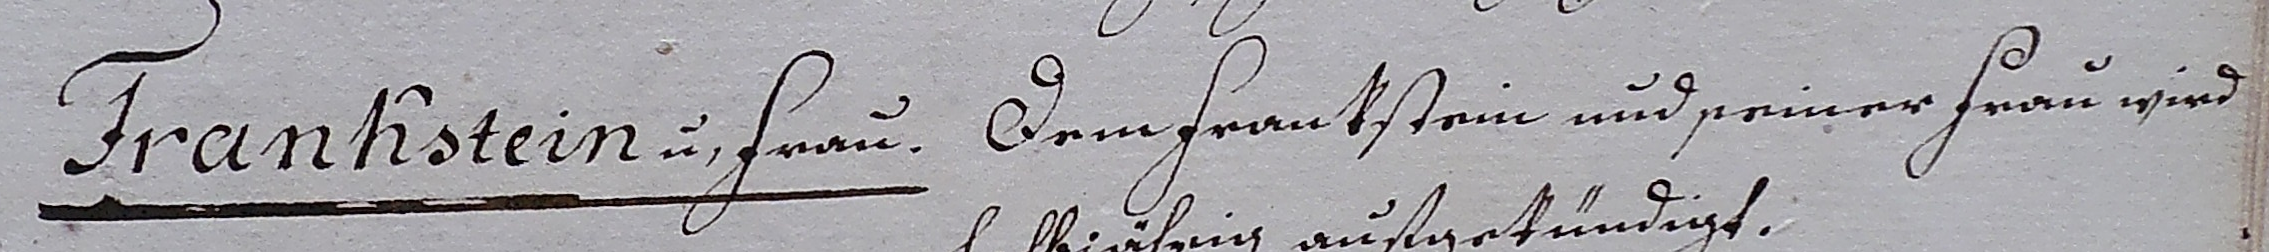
Frankstein u, Frau. Dem Frankstein und seiner Frau wird
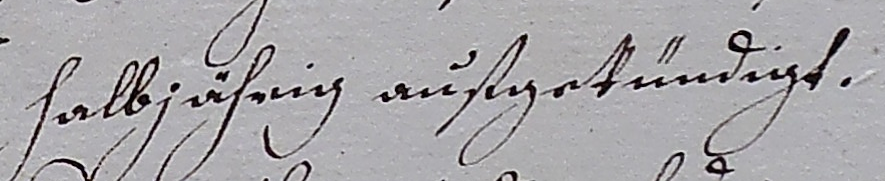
halbjährig aufgekündigt.
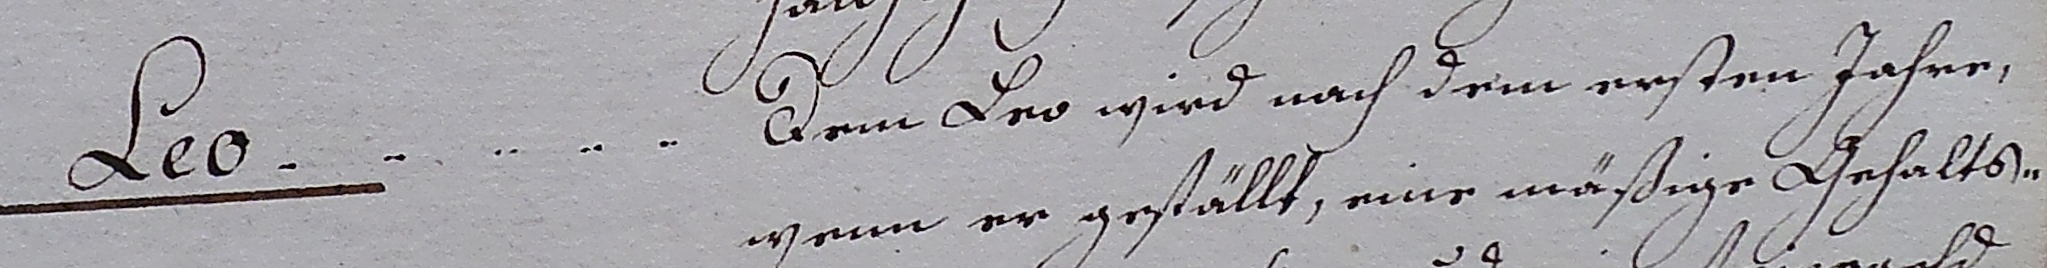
Leo .. .. .. .. .. Dem Leo wird nach dem ersten Jahre,
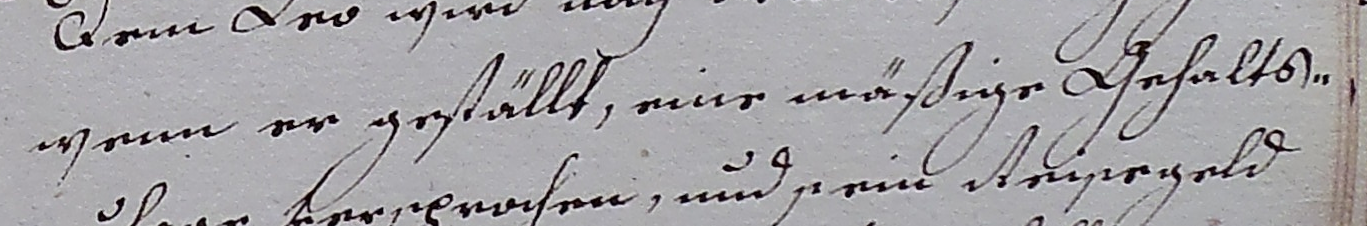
wenn er gefällt, eine mäßige Gehalts¬
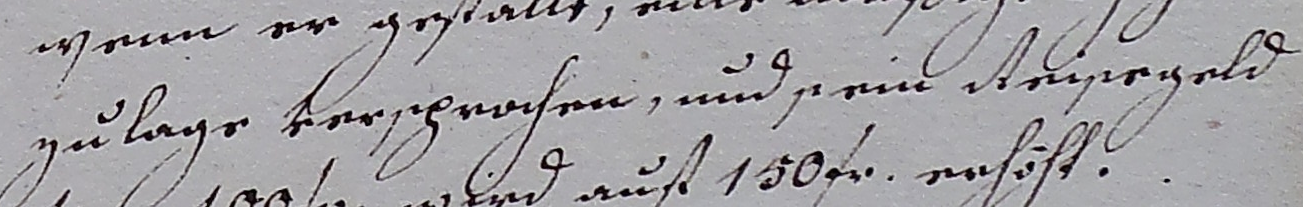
zulage versprochen, und sein Reisegeld
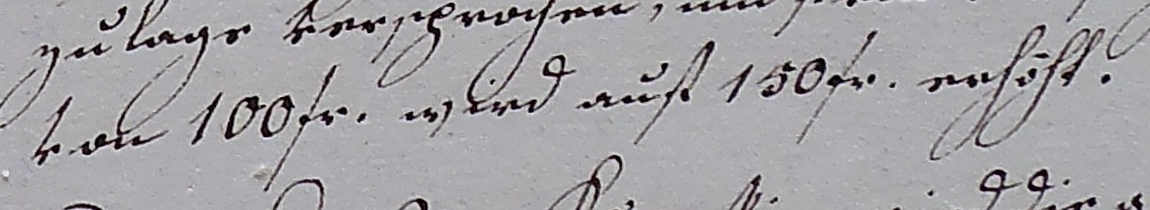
von 100fr. wird auf 150fr. erhöht.
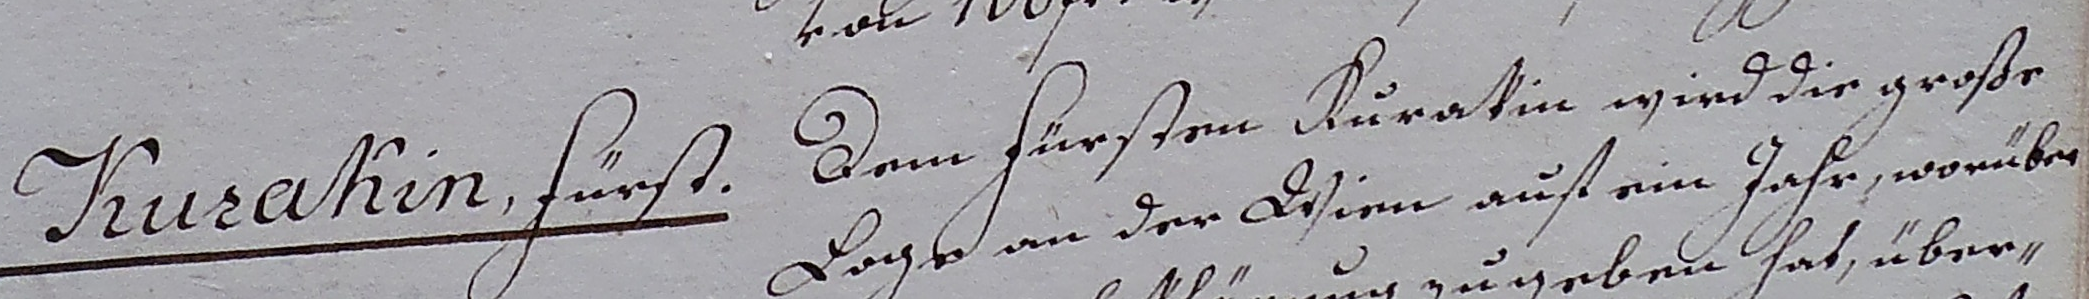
Kurakin, Fürst. Dem Fürsten Kurakin wird die große
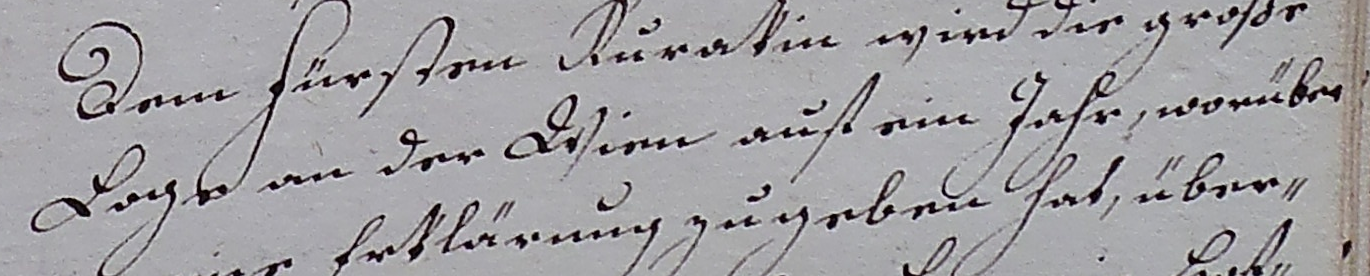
Loge an der Wien auf ein Jahr, worüber
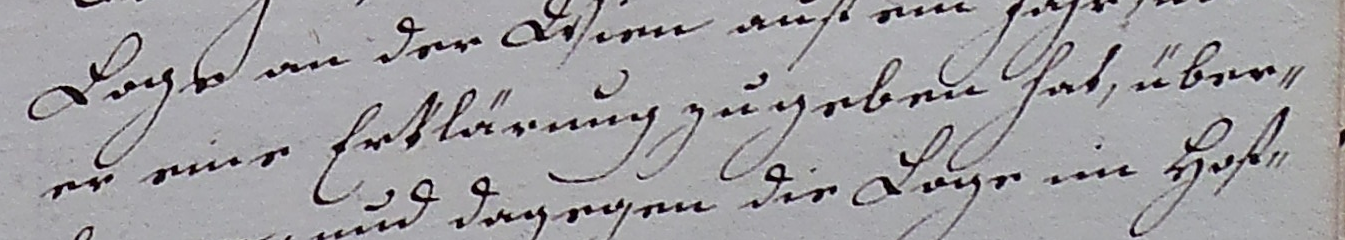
er eine Erklärung zugeben hat, über¬
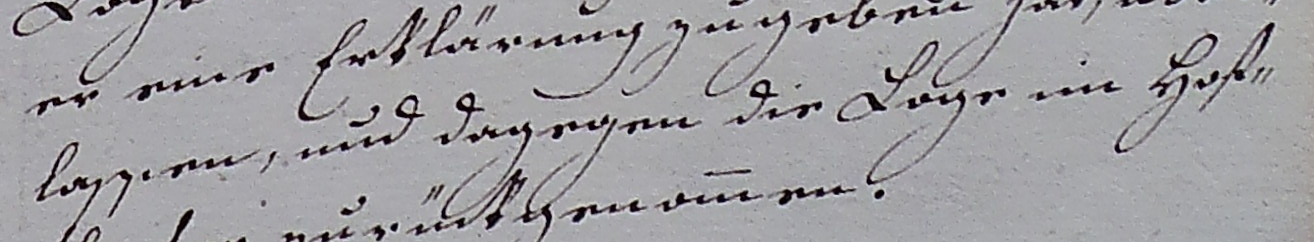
lassen, und dagegen die Loge im Hof¬
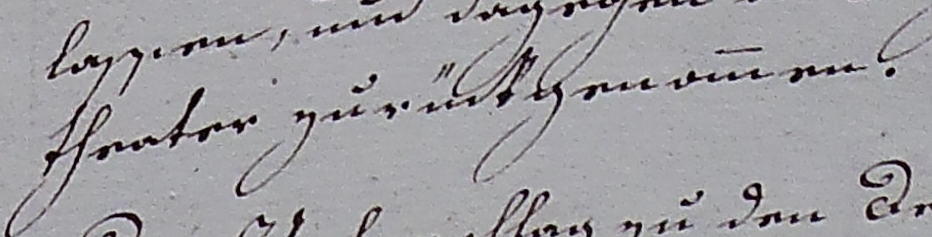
theater zurückgenom̅en.
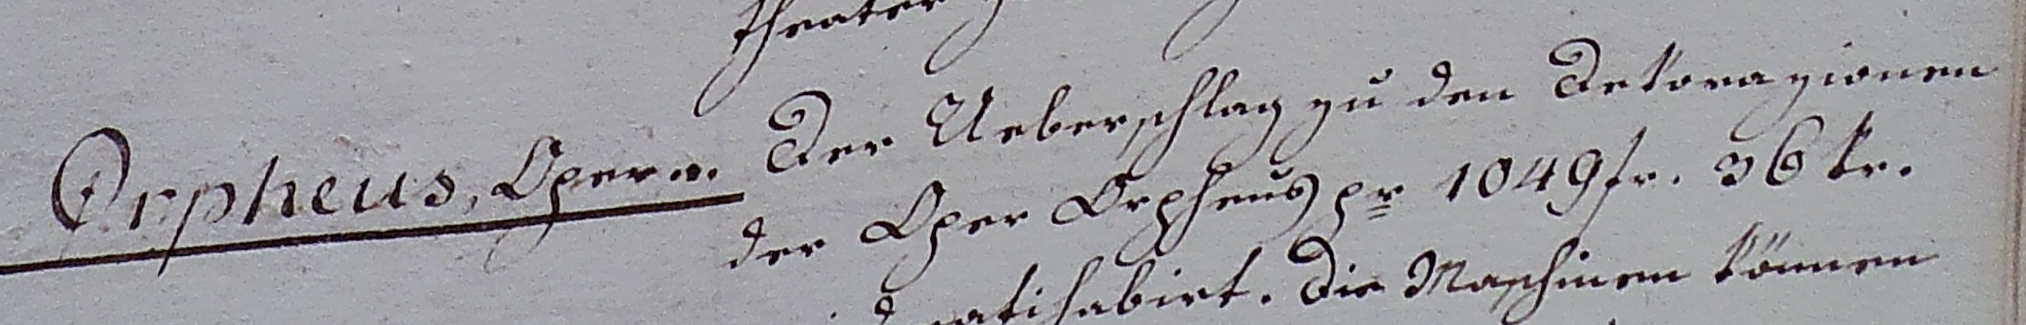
Orpheus, Oper. Der Ueberschlag zu den Dekorazionen
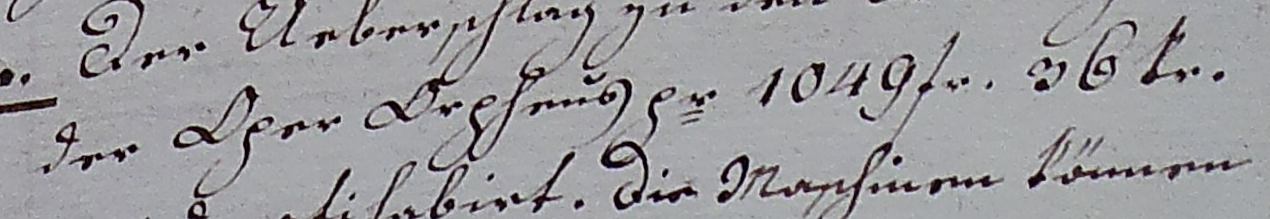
der Oper Orpheus pr͇ 1049fr. 36kr.
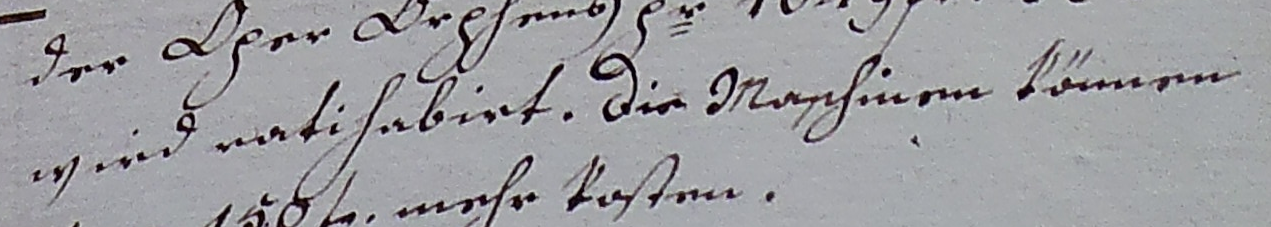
wird ratihabirt. Die Maschinen können
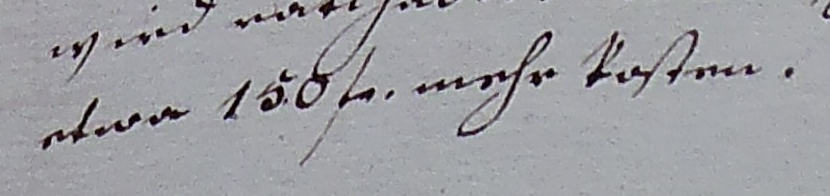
etwa 150fr. mehr kosten.
